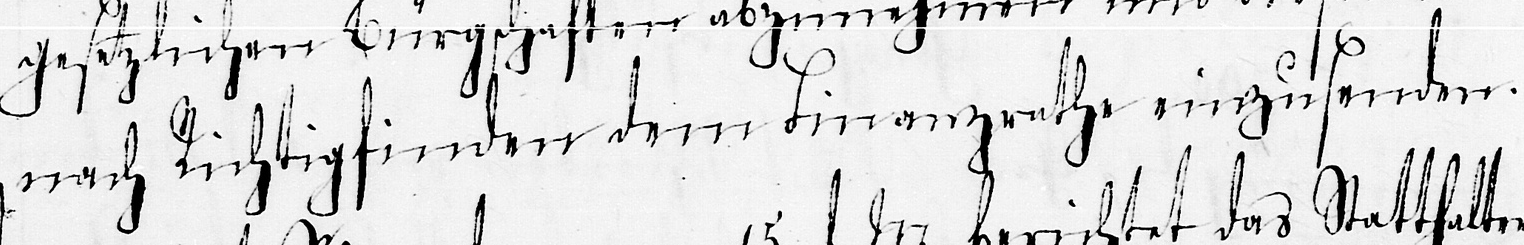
nach Richtigfinden dem Finanzrathe einzusenden.
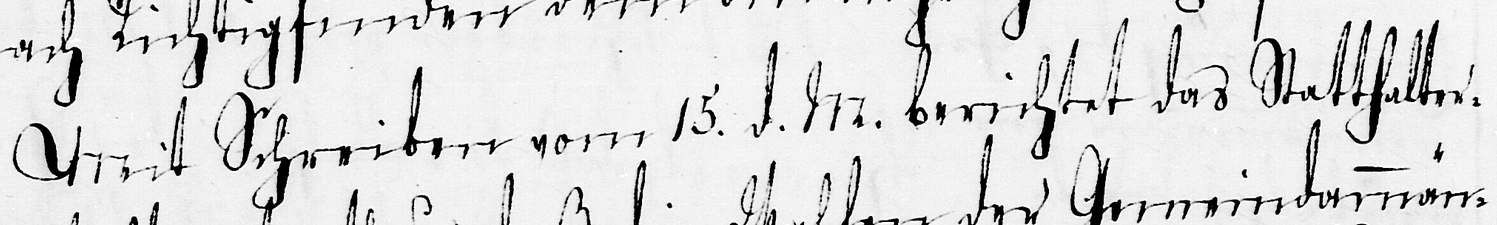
Mit Schreiben vom 15. d. M. berichtet das Statthalte¬
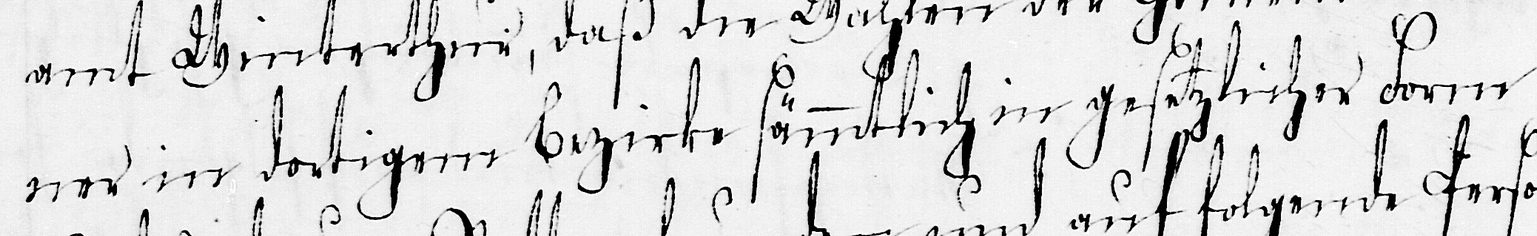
ner in dortigem Bezirke sämmtlich in gesetzlicher Form
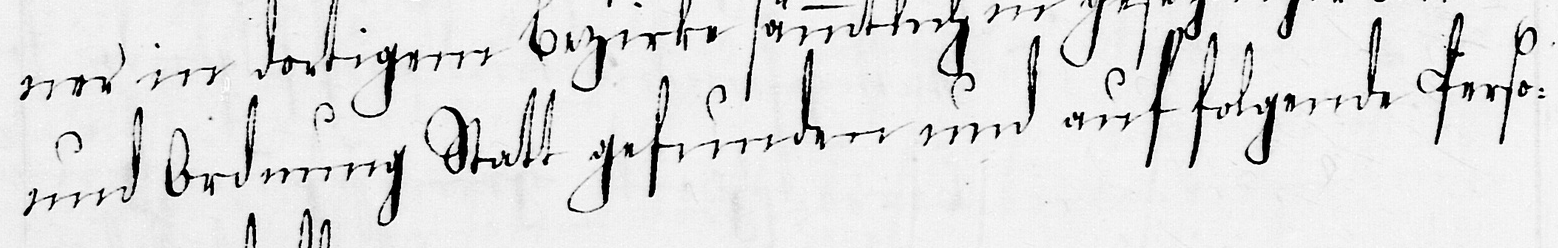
und Ordnung Statt gefunden und auf folgende Perso¬
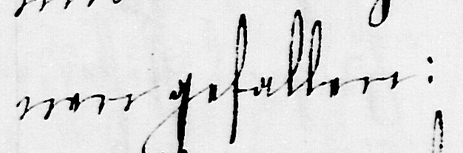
nen gefallen:
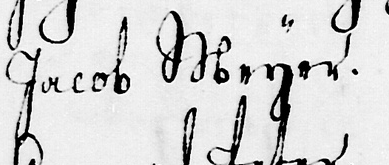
Jacob Meyer.
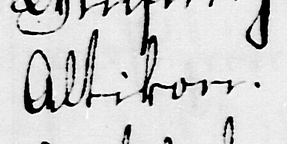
Altikon.
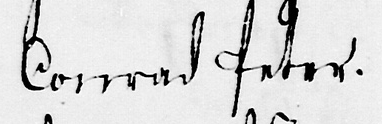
Conrad Peter.
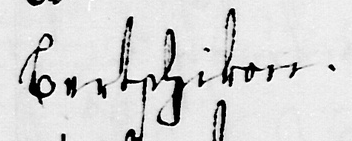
Bertschikon.
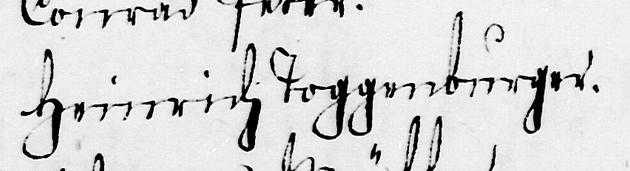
Heinrich Toggenburger.
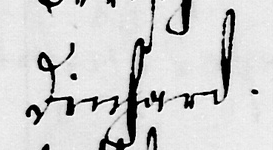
Dinhard.
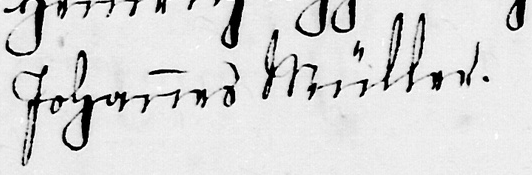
Johannes Müller.
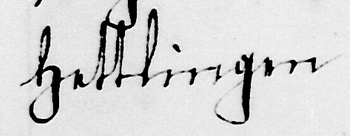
Hettlingen
